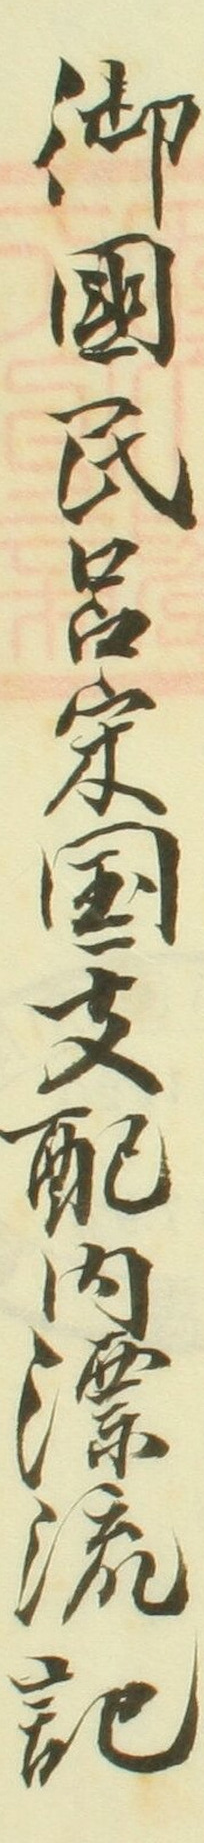御国民呂宋国支配内漂流記

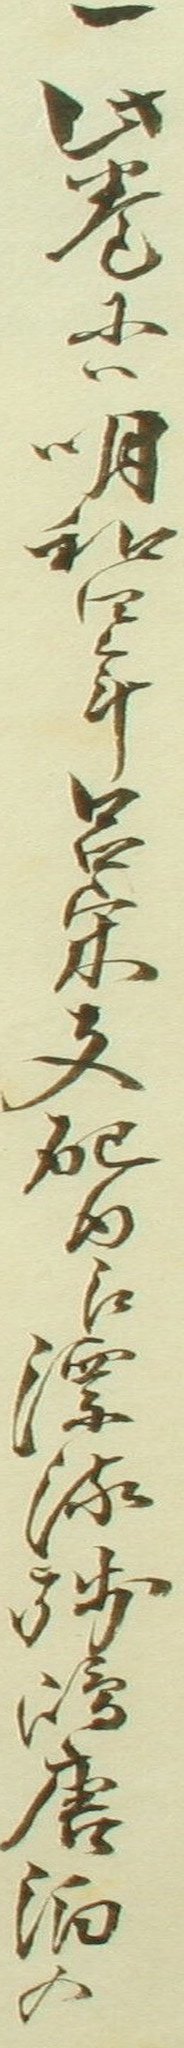一此巻には明和四年呂宋支配内江漂流騎嶋唐泊の
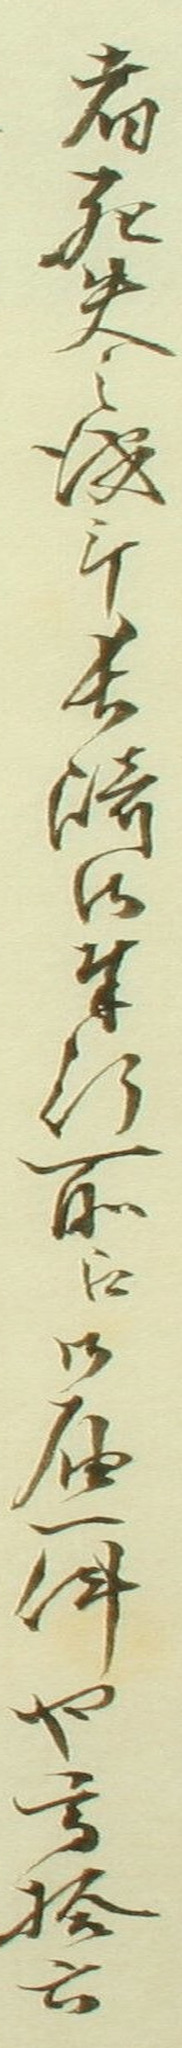者死失之儀斗長崎御奉行所江御届一件や号拾六
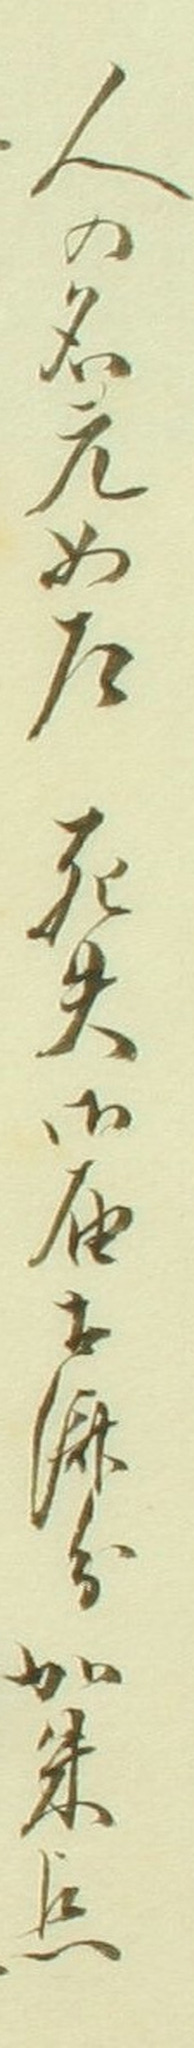人の名元如左死失御届に済分加米点
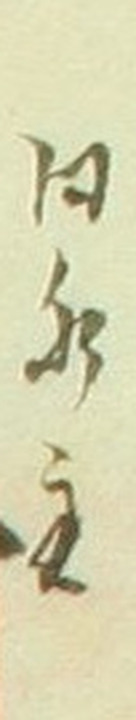同水主
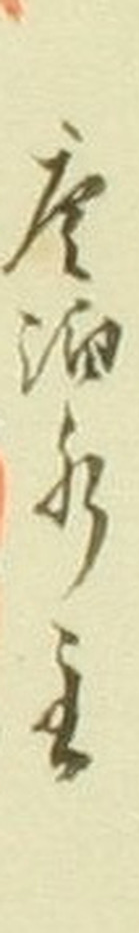唐泊水主
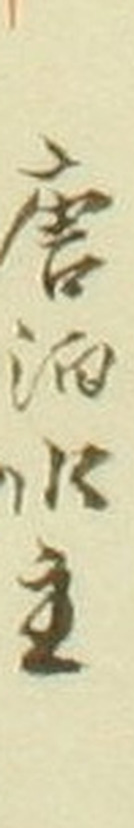唐泊水主
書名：御国民呂宋国支配内漂流記
